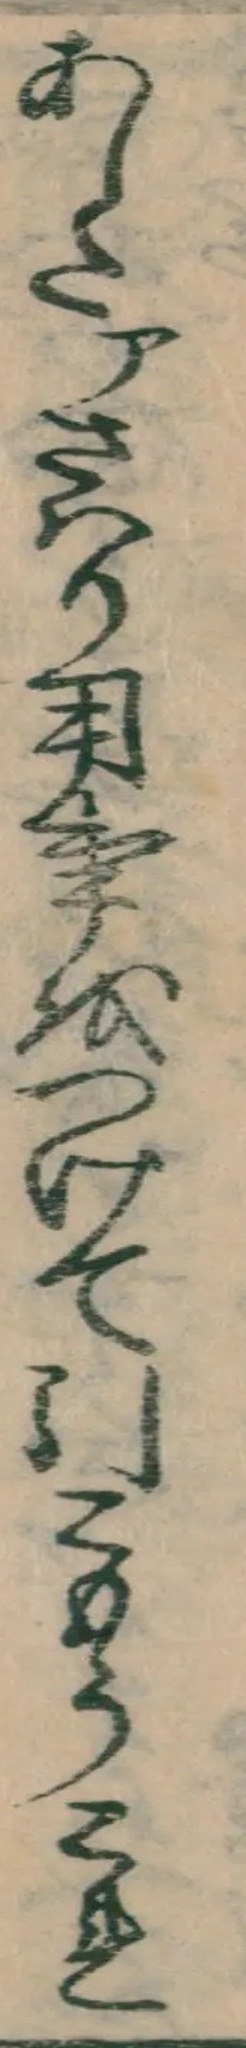あしたァさはり用事をつけて引こもうこれ
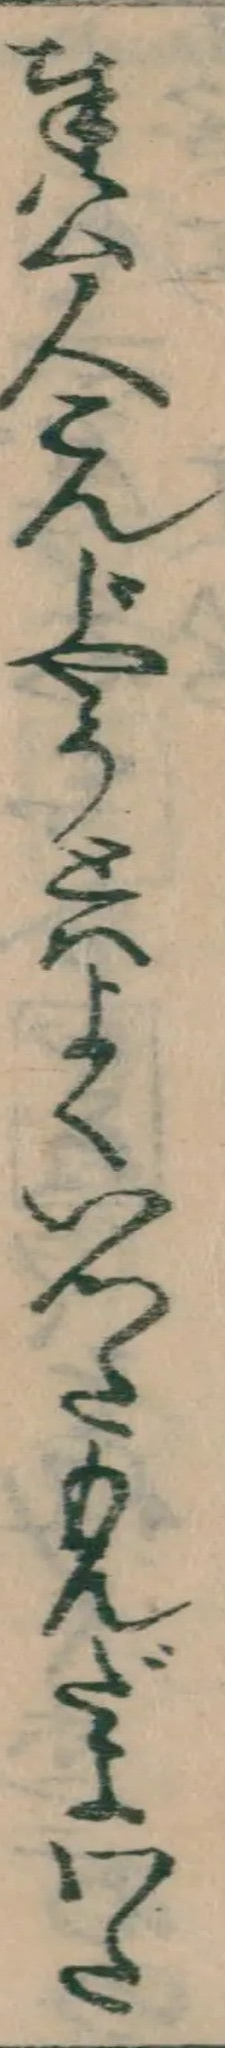奉公人こんじやうとはよくいつたもんだよわた
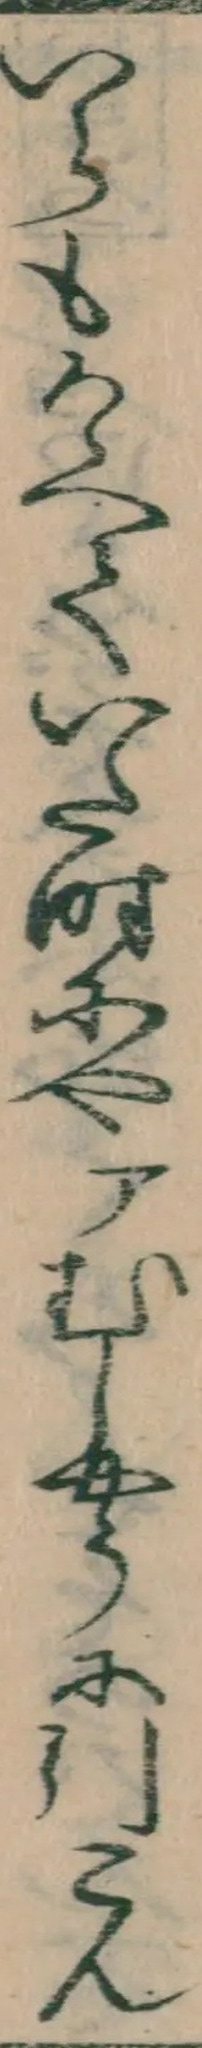いらもかゝへていた時にやァむしやうに引こん
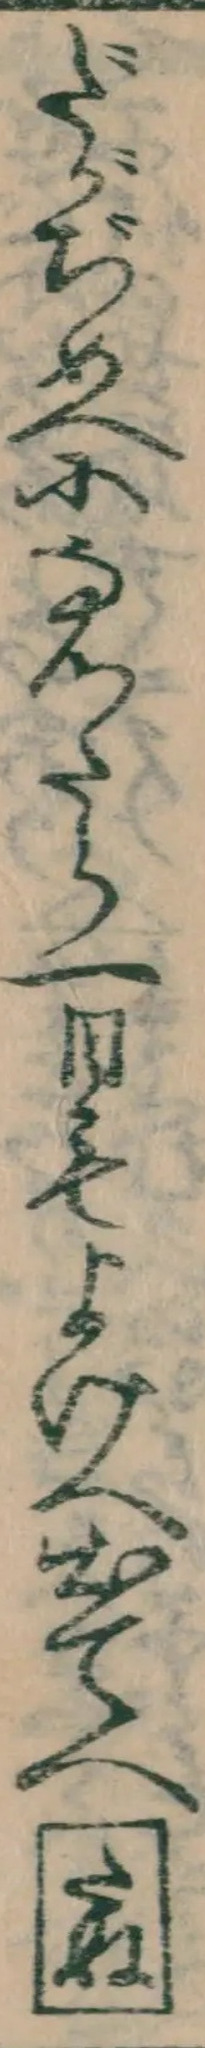だがぢめへになつたら一日もよけへ出てへ〈たね〉
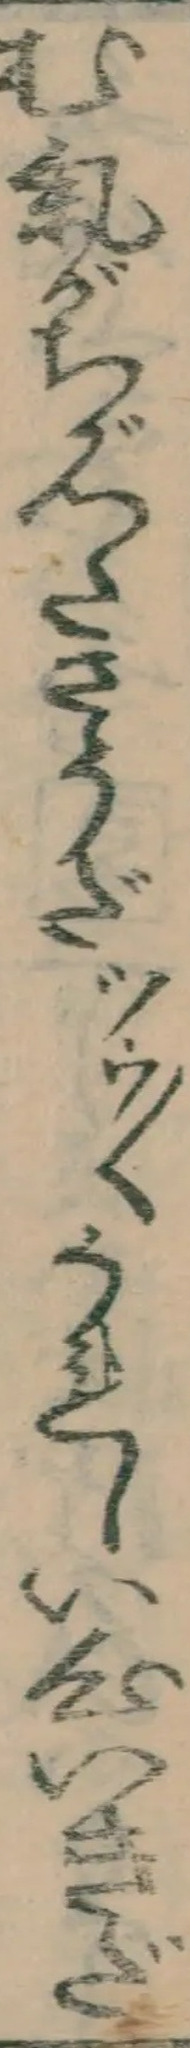む気がちがつたさうツウ〳〵うれしい心いきだ
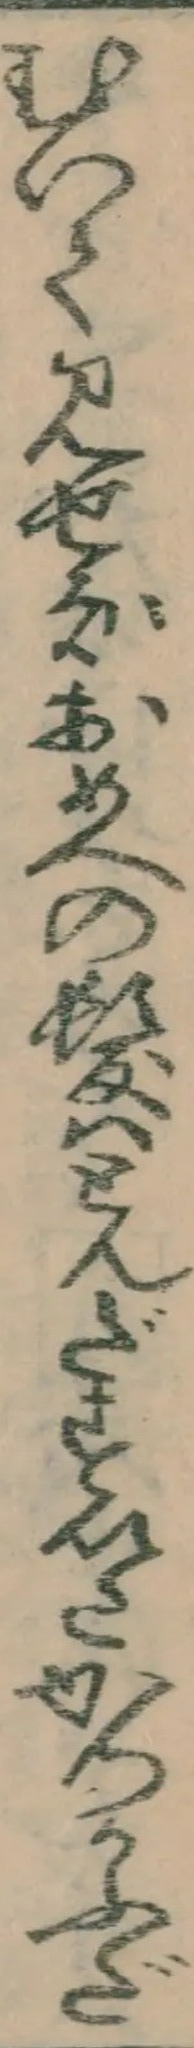むいて見せなおめへの髪はとんだすいたかつかふだ
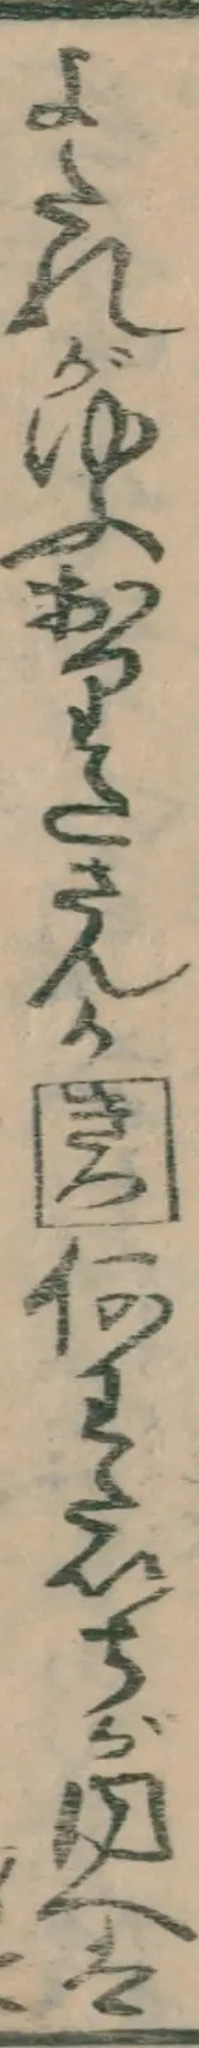よたれがゆふおりたさんか〈きつ〉何わたいら？が内へは
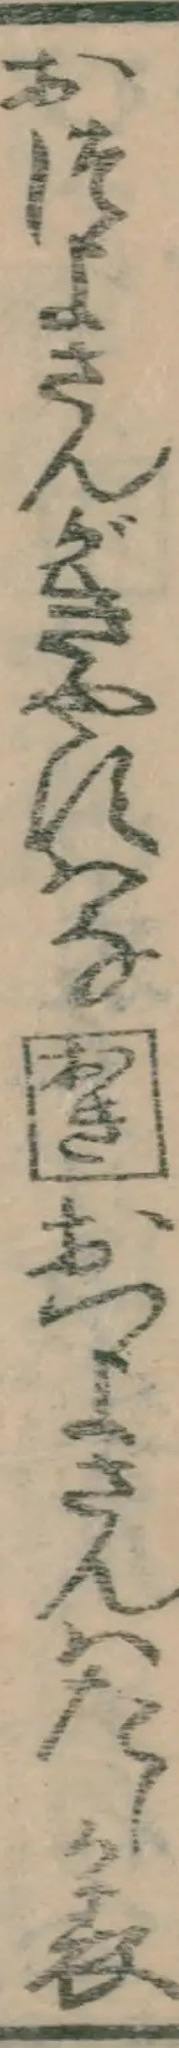おつよさんがきやすはな〈おき〉おつよさんはたしか表
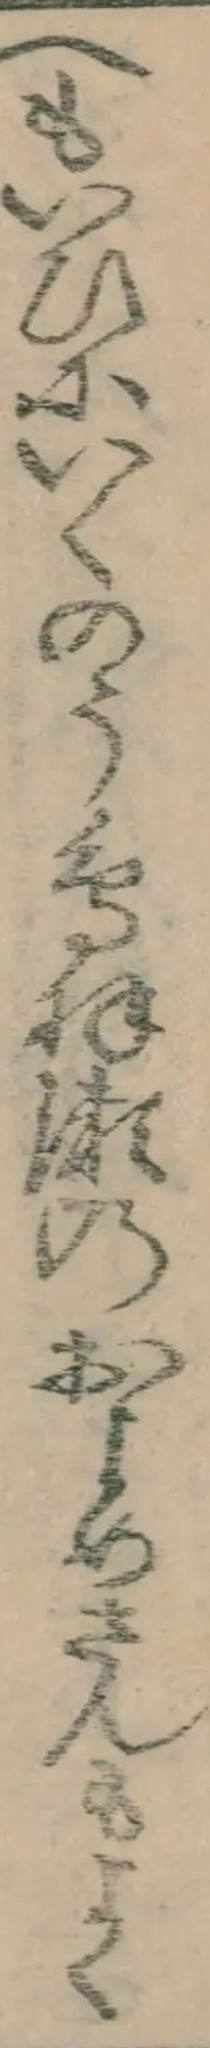へもいひにいくのう鳥羽瀬のおよめさんもよく
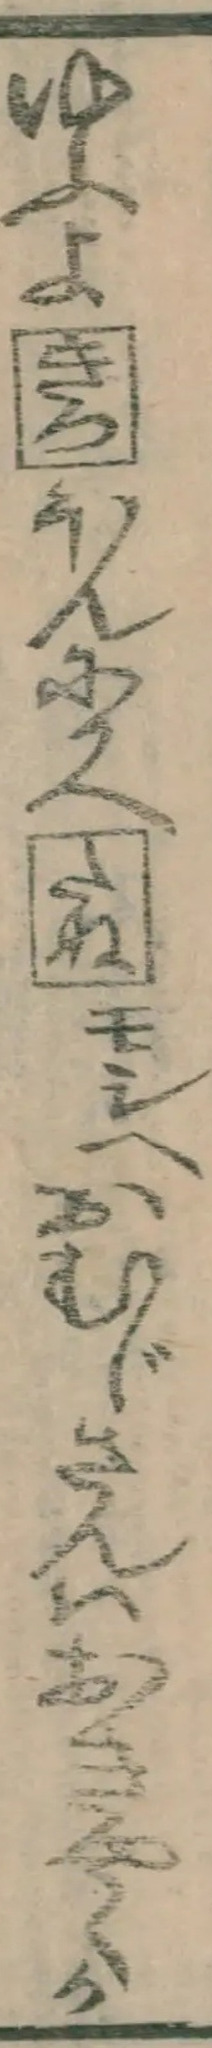ゆふよ〈きつ〉ほんにかへ〈たね〉モシヘおむじさんはおきやくか
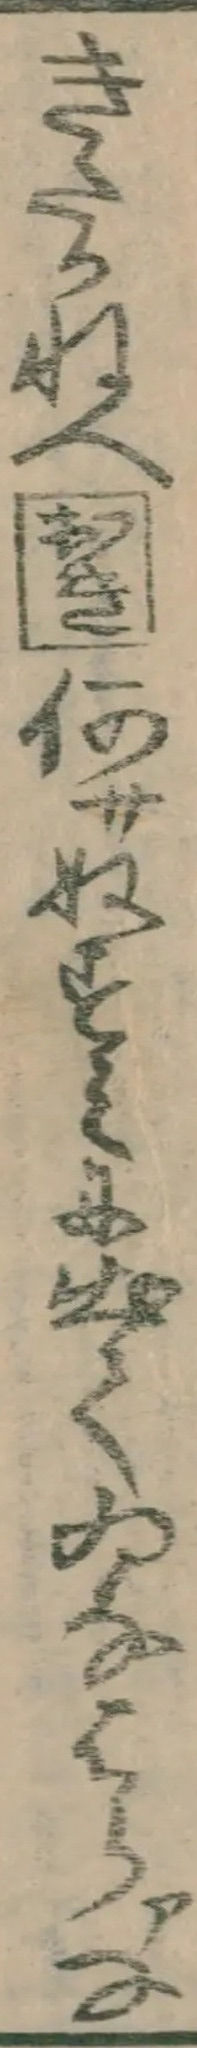きたかねへ〈おき〉何サぬすみに出てゐなはらァな

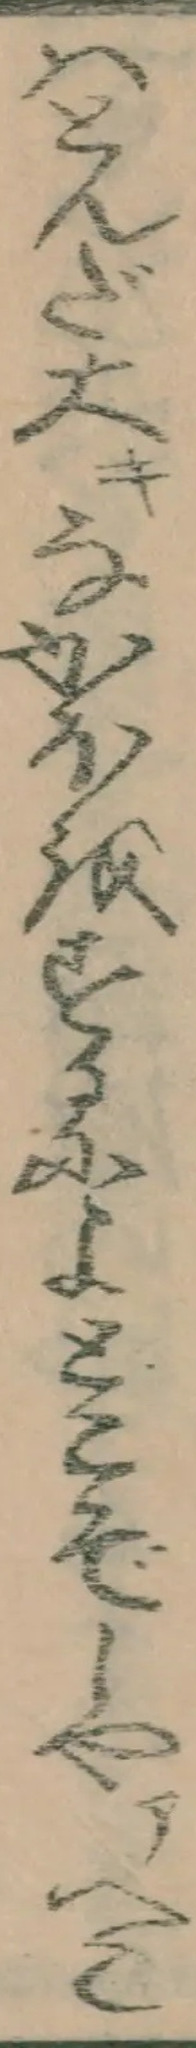はとんだ大きなかほをするによとこぞしやァへこ
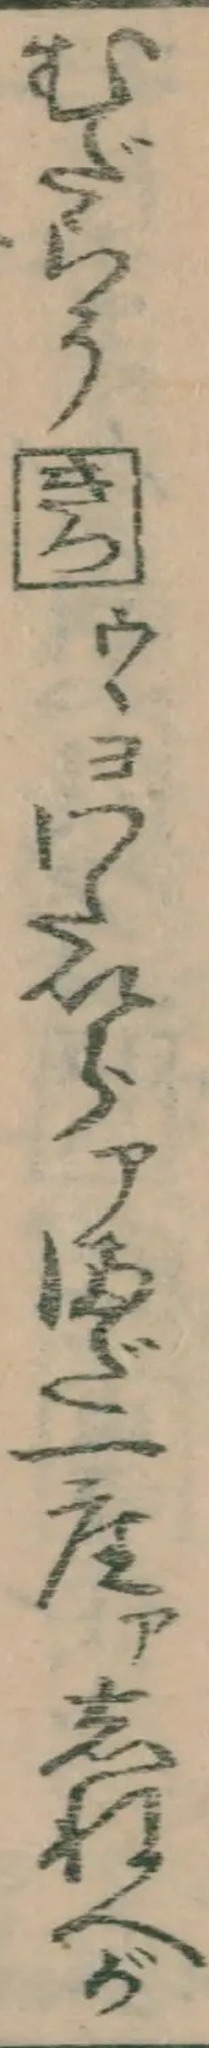むだらう〈きつ〉ウヽヨわたいらァまだ一座ァしねへが
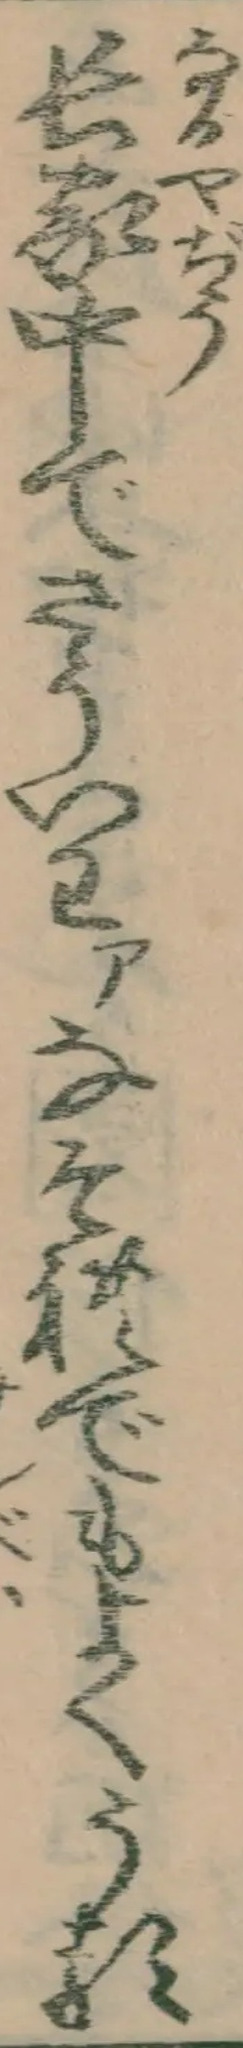長家中でさういわァなそれでもよくうる
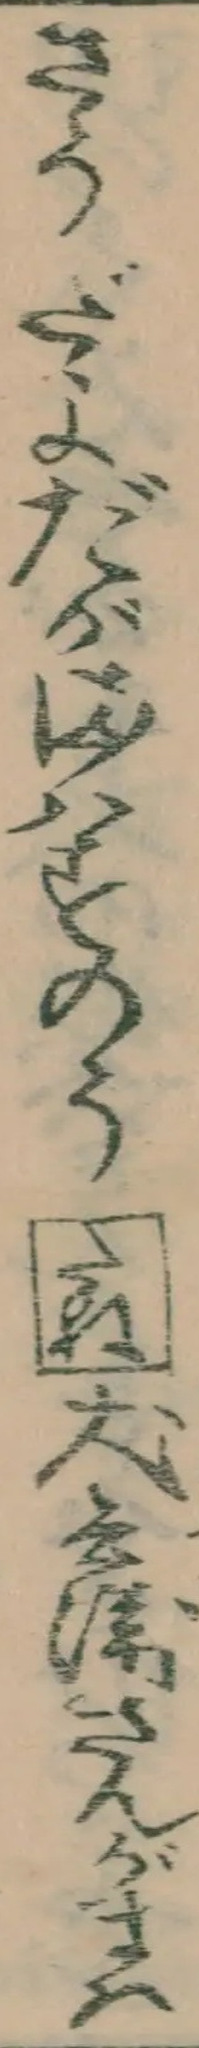さうだよだがまはすのう〈たね〉犬兵衛さんがまは
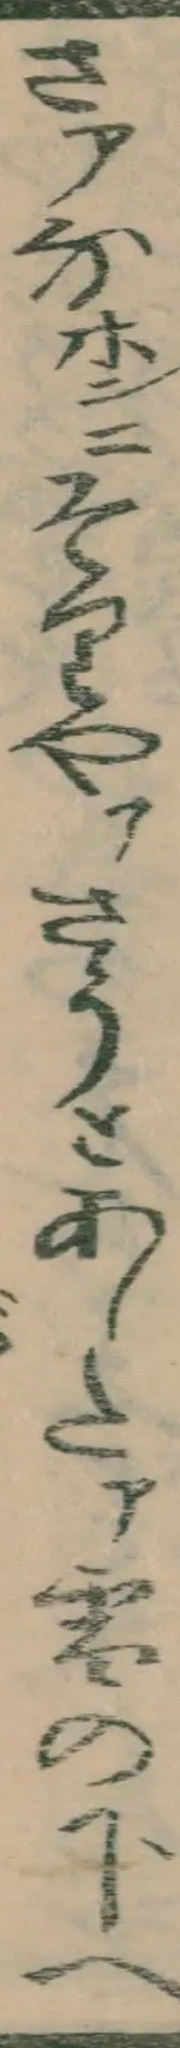さァなホンニそりやァさうとあしたァ雪の下へ
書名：教訓読本：大礒風俗仕懸文庫
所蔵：国立国会図書館 National Diet Library, JAPAN
